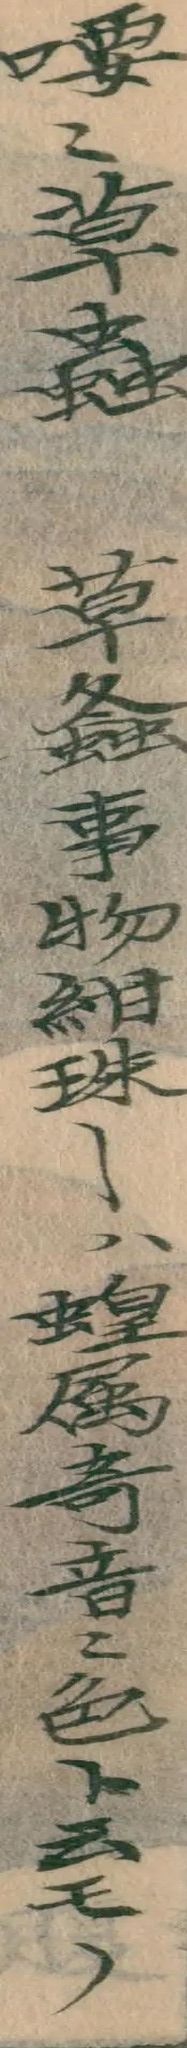喓々草蟲草螽事物紺珠－ハ蝗属奇音々色ト云モノ
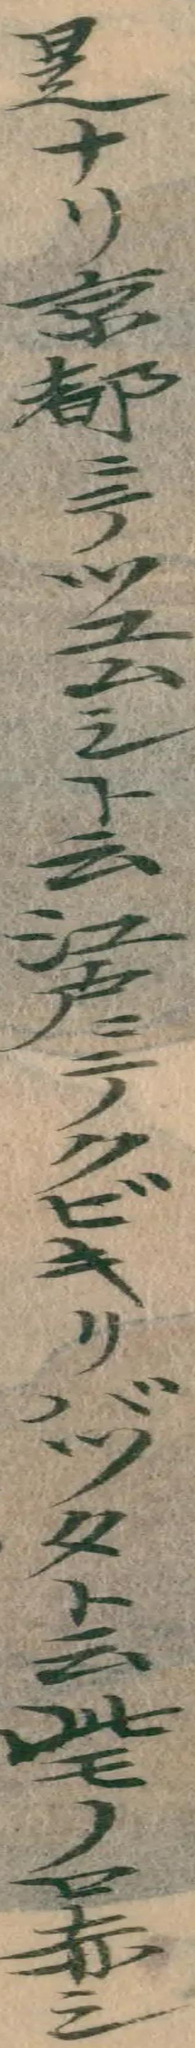是ナリ京都ニテツユムシト云江戸ニテクビキリバツタト云此モノ口赤シ
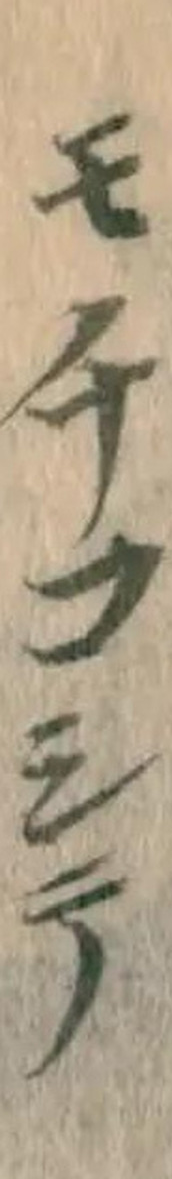モチコシテ
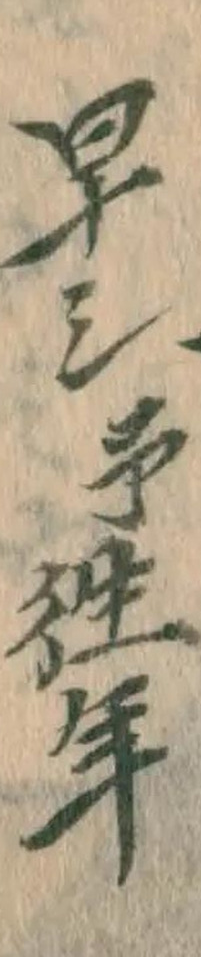早シ予往年
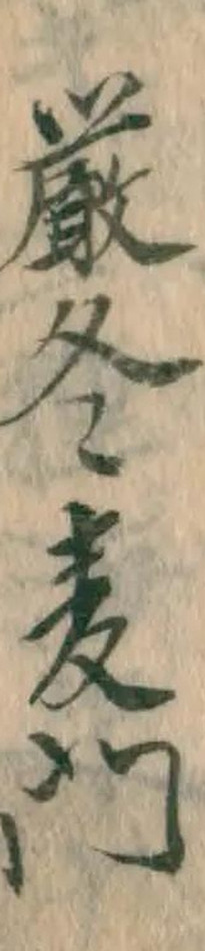厳冬麦門
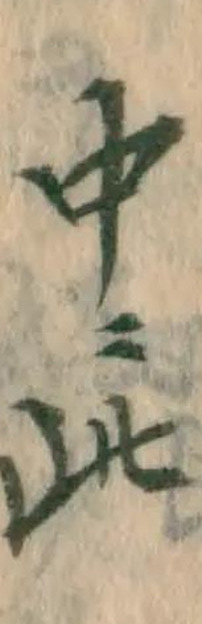中ニ此
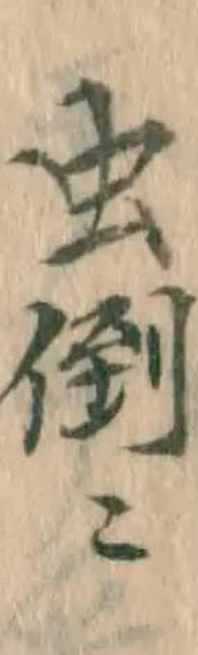虫倒ニ
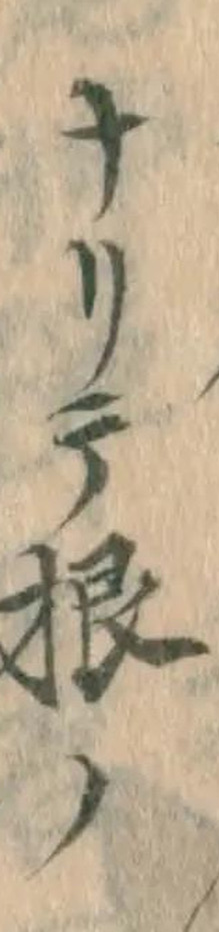ナリテ根ノ
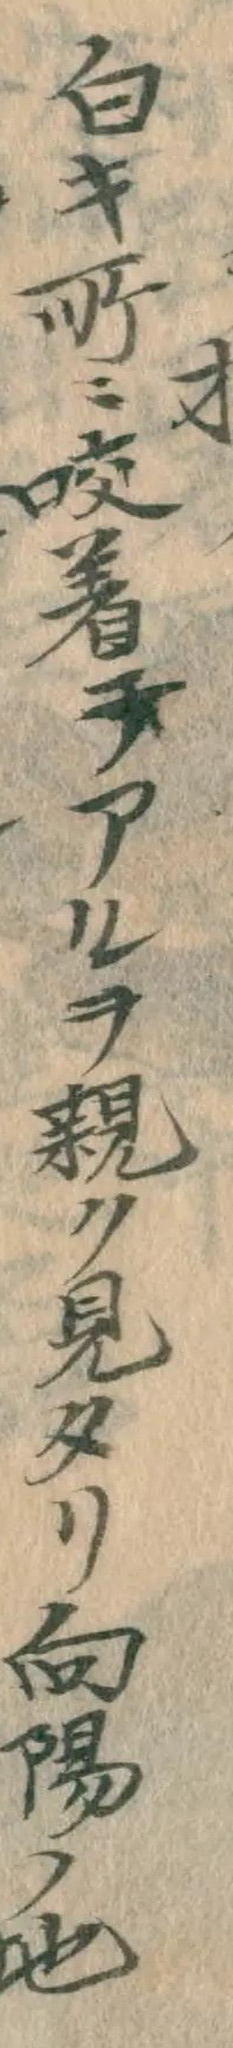白キ所ニ咬着テアルヲ親ク見タリ向陽ノ地
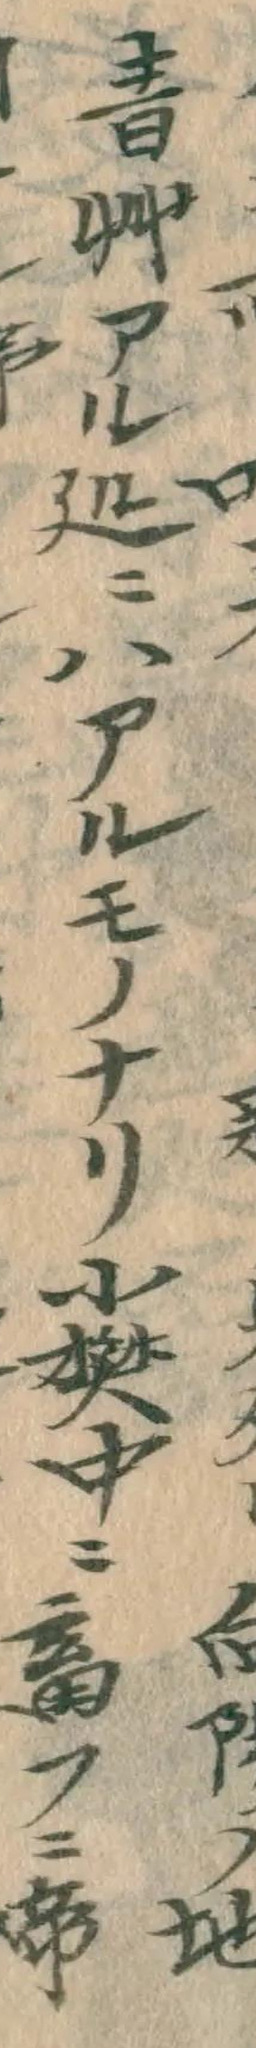書艸アル処ニハアルモノナリ小樊中ニ畜フニ啼
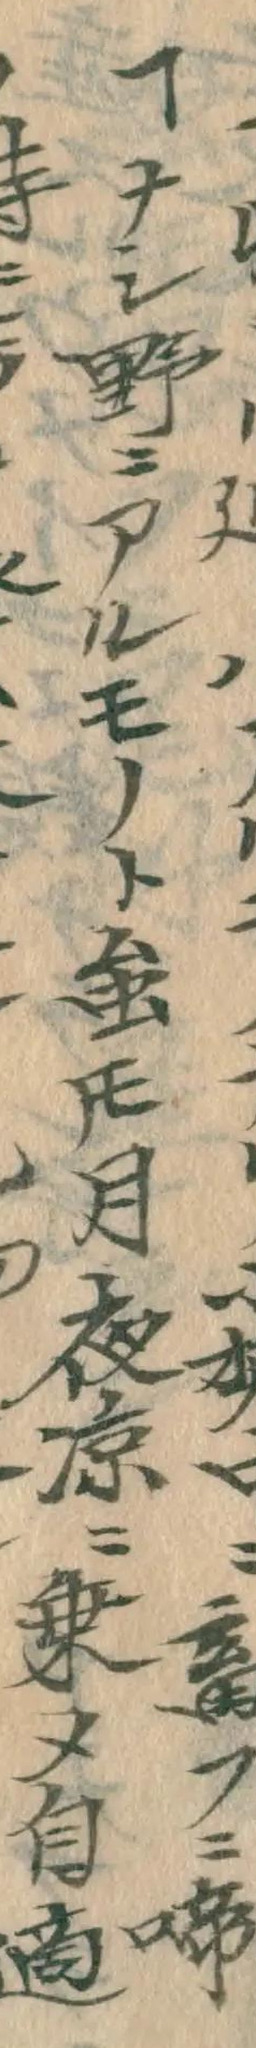コトナシ野ニアルモノト虽トモ月夜涼ニ乗シテ自適
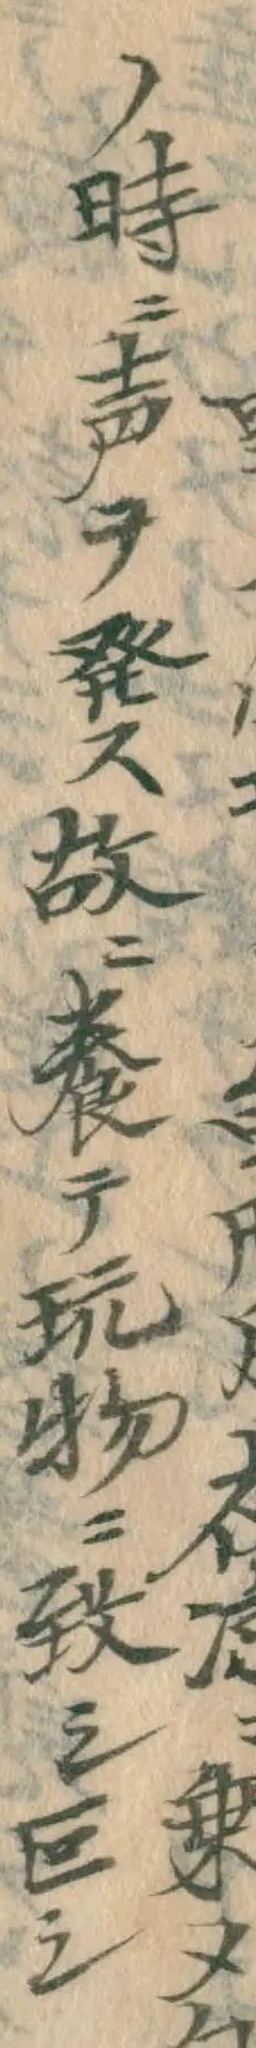ノ時ニ声ヲ発ス故ニ養テ玩物ニ致シ叵シ

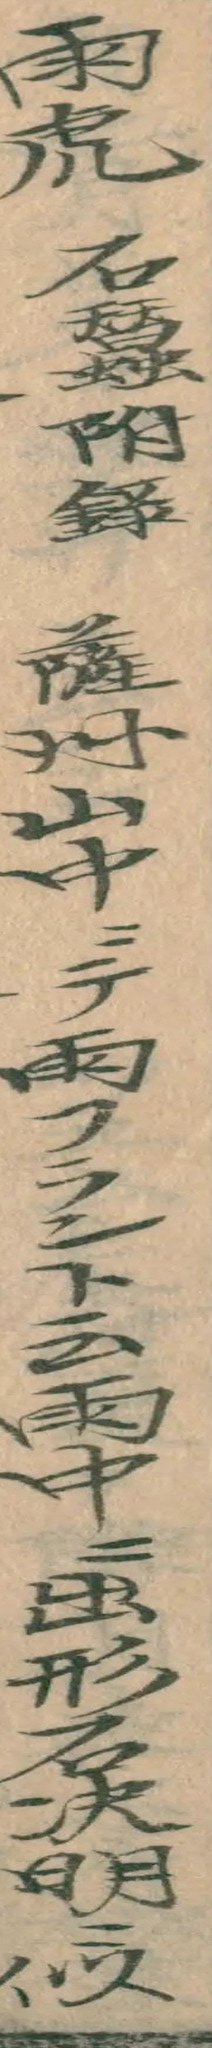雨虎石蠺附録薩州山中ニテ雨フラント云雨中ニ出形石决明ニ似
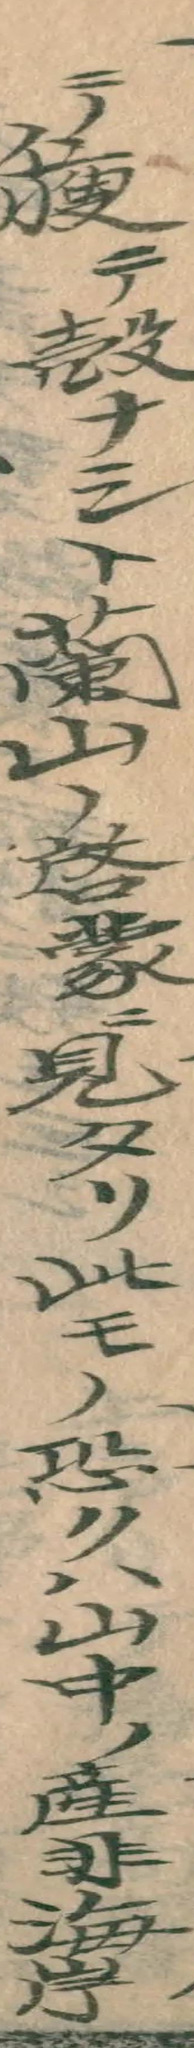テイ痩テ殻ナシト蘭山ノ啓蒙ニ見タリ此モノ恐クハ山中ノ産非海岸
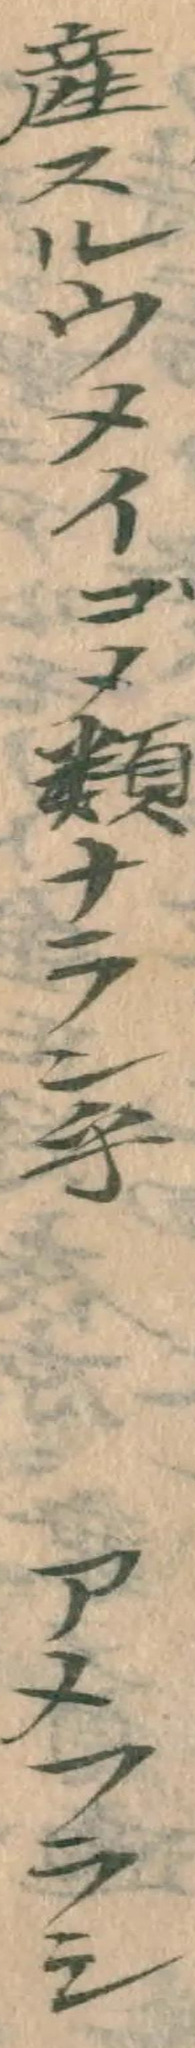産スルウメイゴノ類ナラン乎アメフラシ
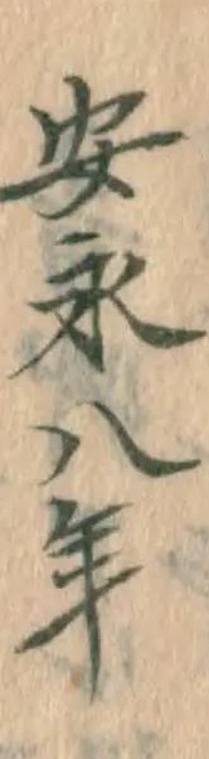安永八年
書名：千蟲譜 3巻. [2]
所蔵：国立国会図書館 National Diet Library, JAPAN
